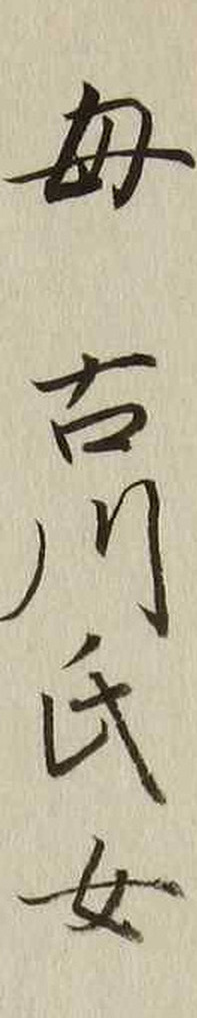母古川氏女
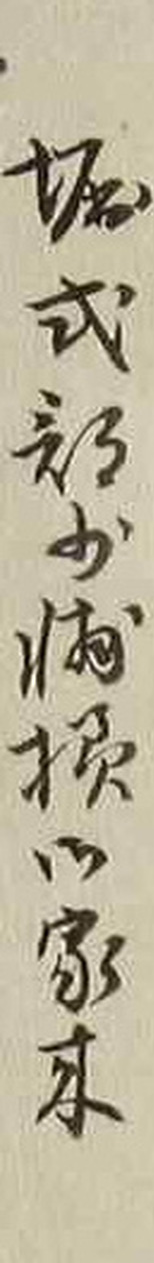堀式部少輔様御家来
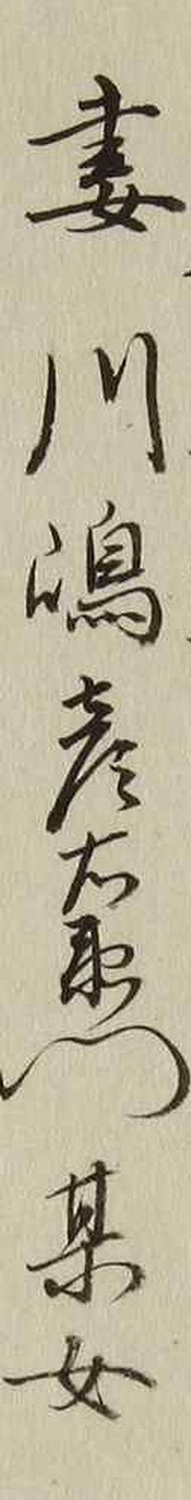妻川嶋彦右衛門某女
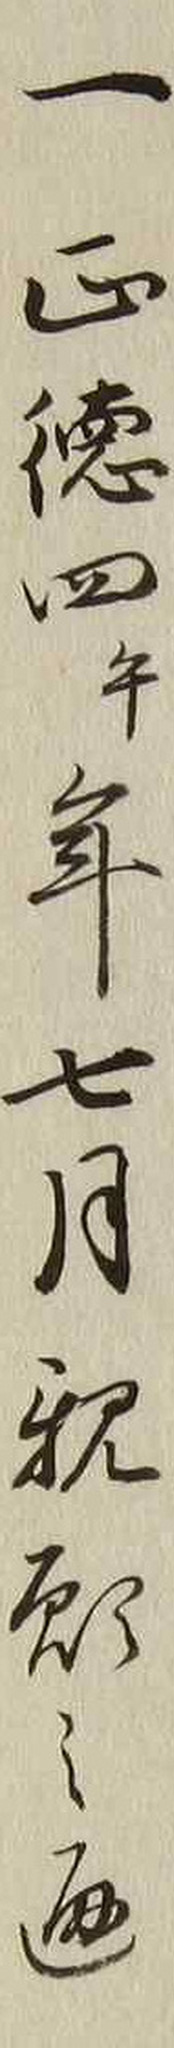一正徳四午年七月親願之通
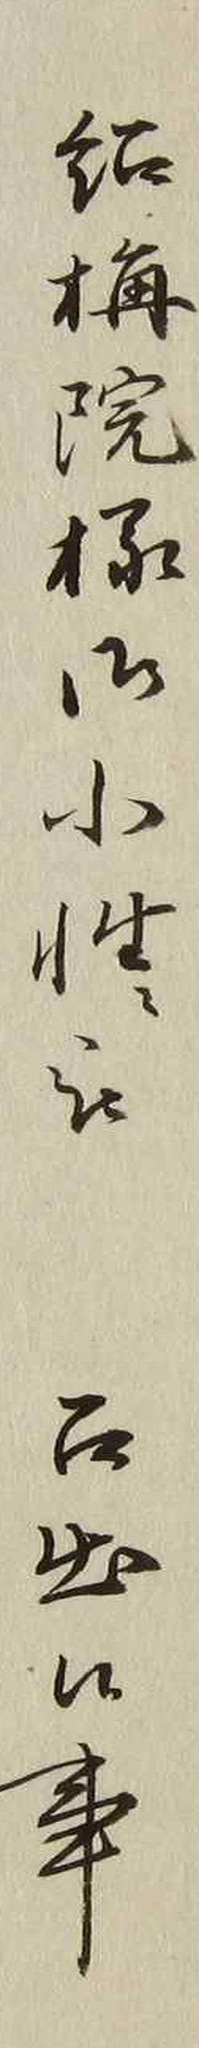紹栴院様御小性ニ被召出候事
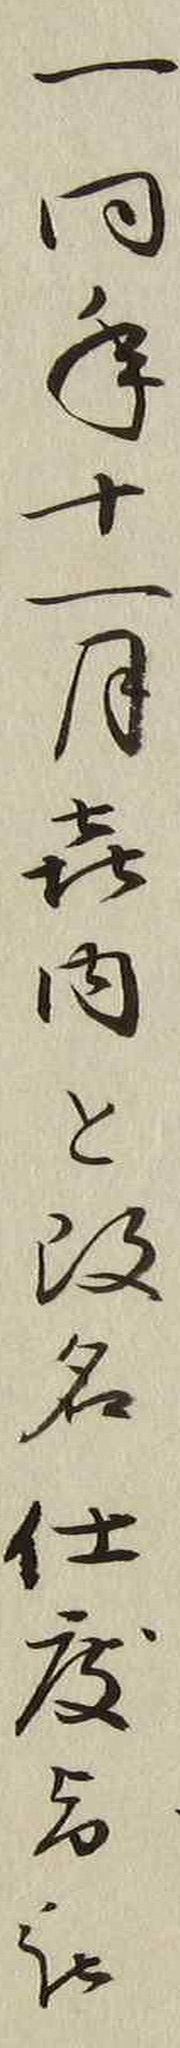一同年十一月喜内と改名仕度旨被
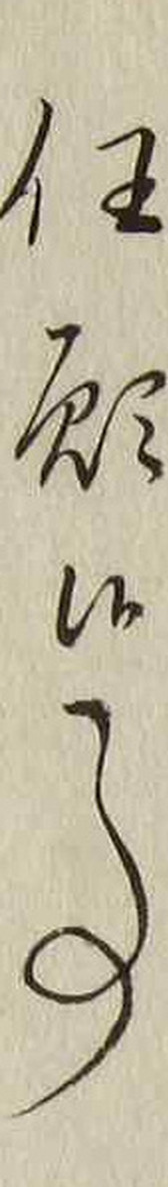任願候事
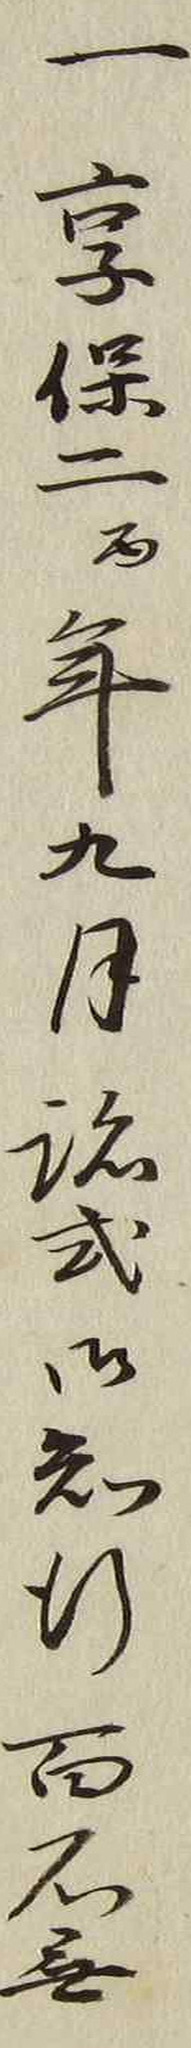一享保二酉年九月諸式御知行百石無
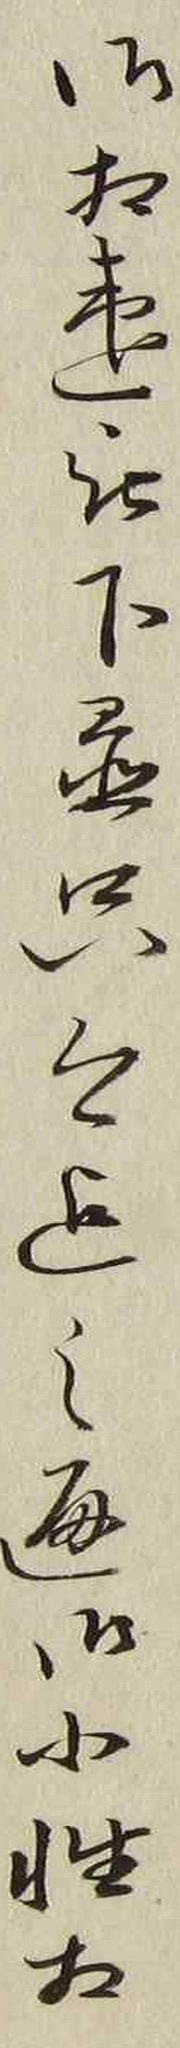御相違被下置只今迄之通御小性相
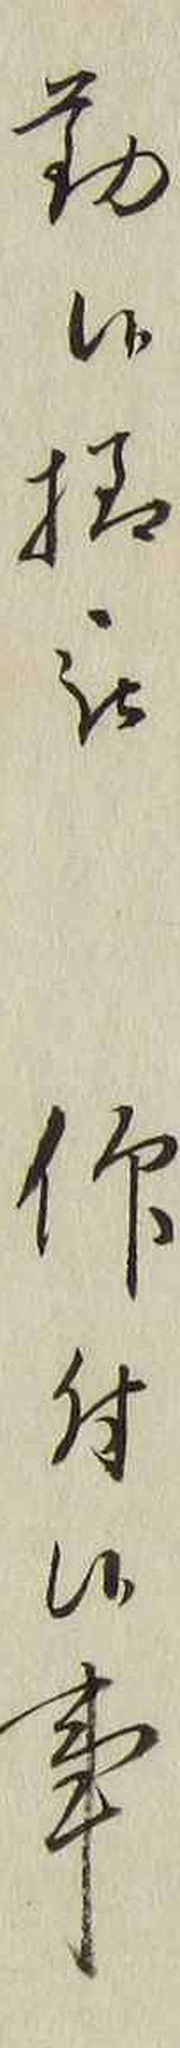勤候様被仰付候事
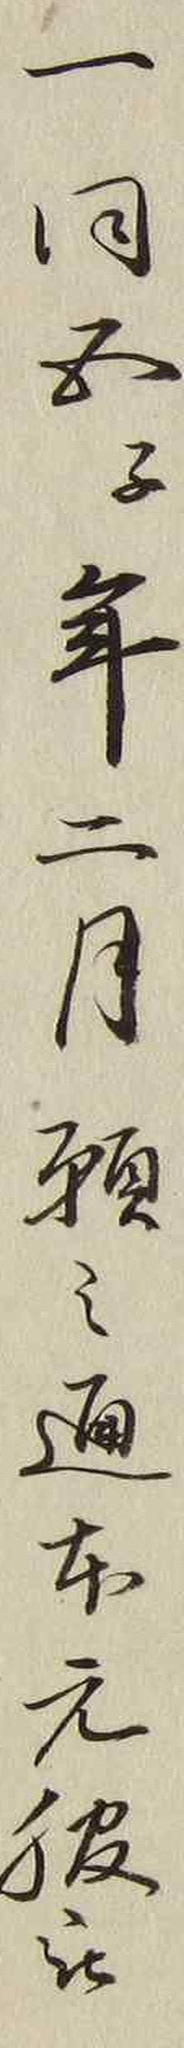一同五子年二月願之通本元服被

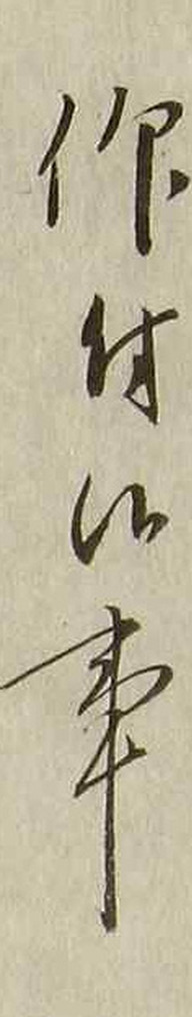仰付候事
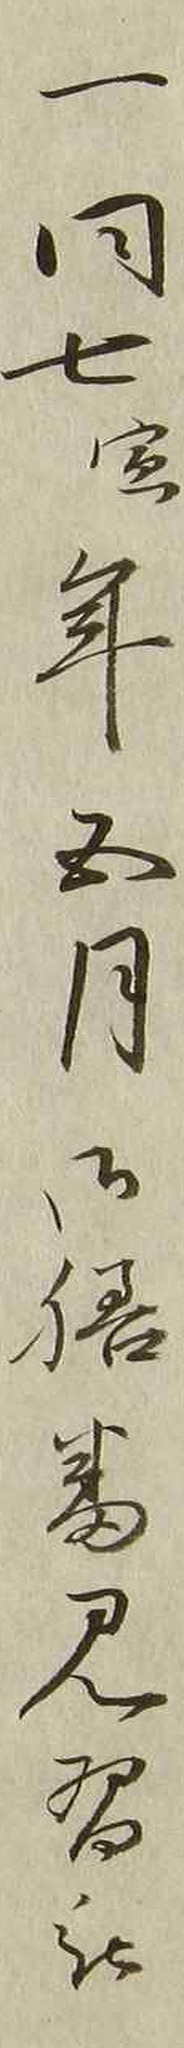一同七寅年五月御膳番見習被
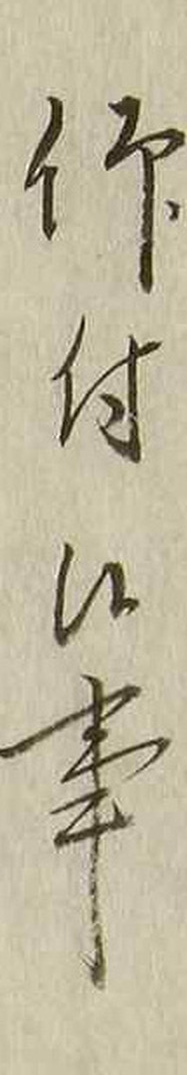仰付候事
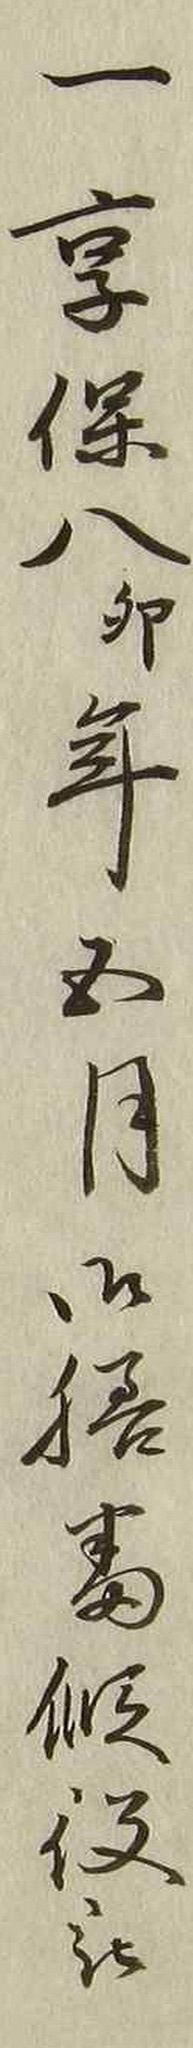一享保八卯年五月御膳番假役被
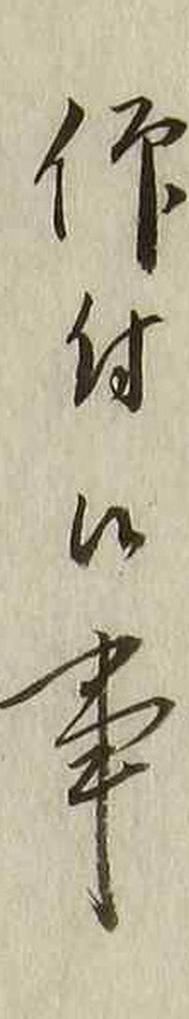仰付候事
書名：諸士系譜　巻之19　い之部19
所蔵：会津若松市立会津図書館
